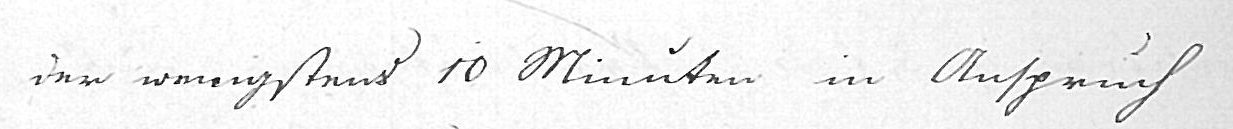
der wenigstens 10 Minuten im Anspruch
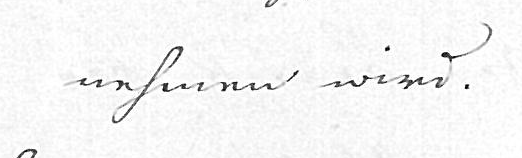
nehmen wird.
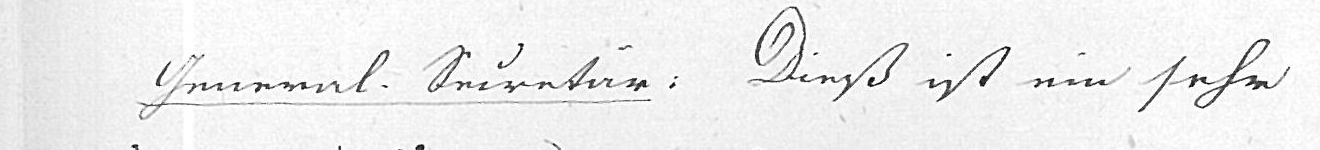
General-Secretär: Dieß ist ein sehr
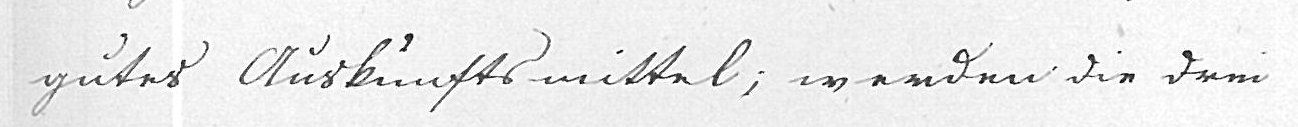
gutes Auskunftsmittel; werden die drei
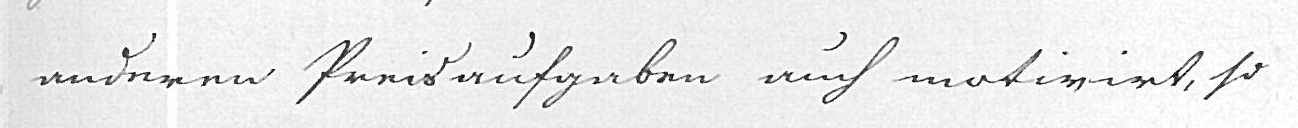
anderen Preisaufgaben auch motivirt, so
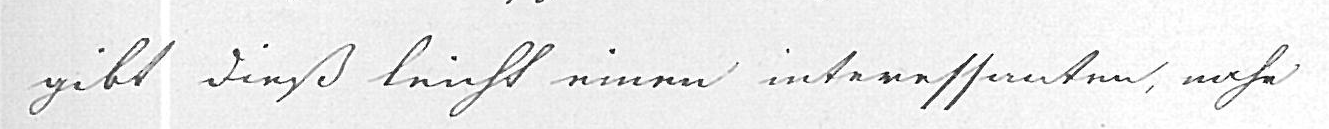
gibt dieß leicht einen interessanten, nahe
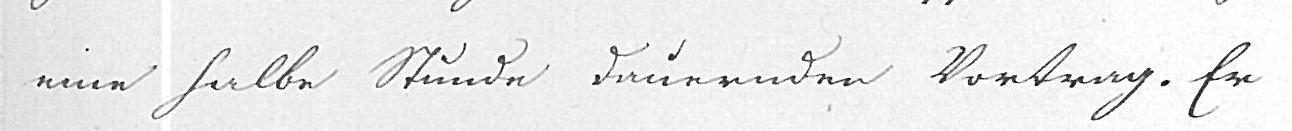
einer halben Stunde dauernden Vortrag. Er
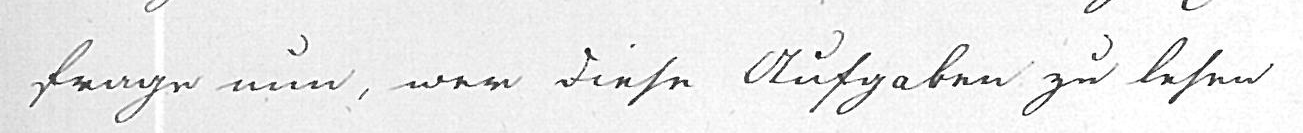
frage nun, wer diese Aufgaben zu lesen
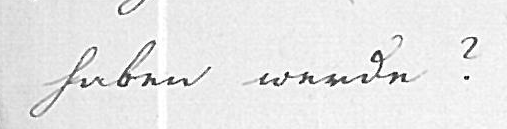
haben werde?
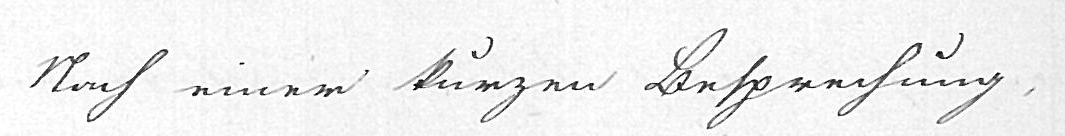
Nach einer kurzen Besprechung,
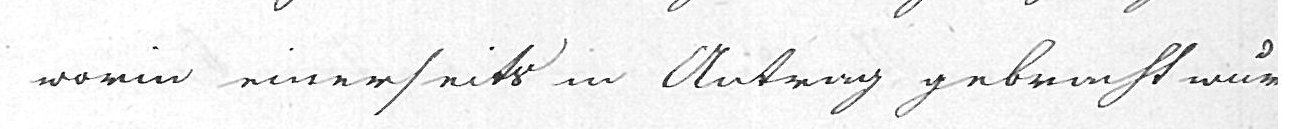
worin einerseits in Antrag gebracht wur-
